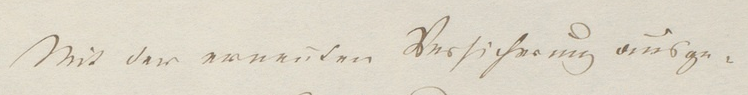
Mit der erneuten Versicherung ausge-
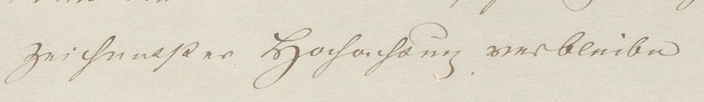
zeichnetster Hochachtung verbleibe
